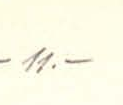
11.
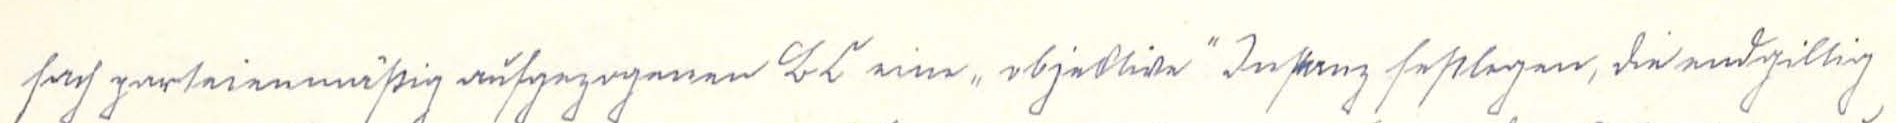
fach parteienmäßig aufgezogenen BC eine "objektive" Instanz festlegen, die endgültig
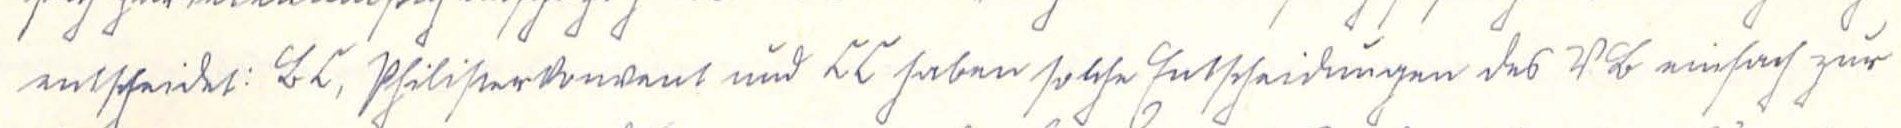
entschließt: BC, Philisterkonvent und CC haben solche Entscheidungen des VB einfach zur
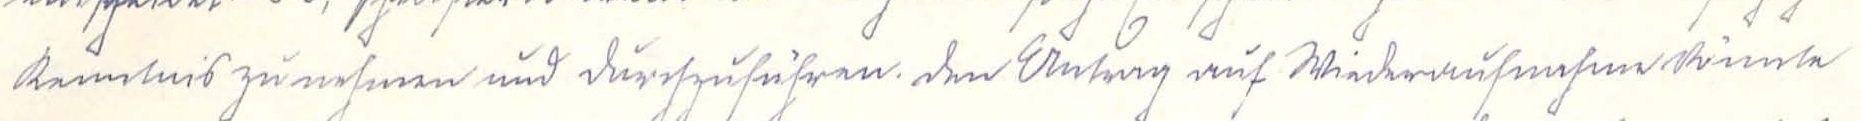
Kenntnis zu nehmen und durchzuführen. Den Antrag auf Wiederaufnahme könnte
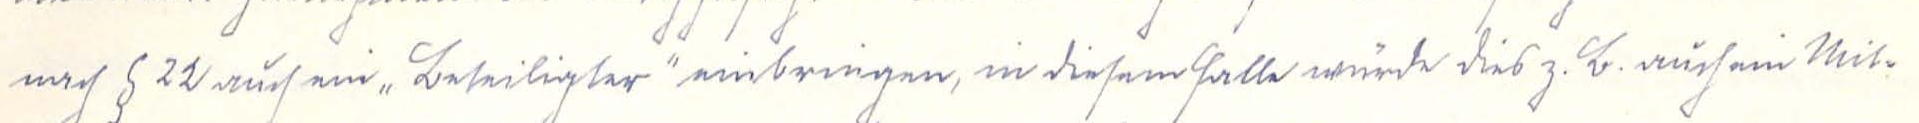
nach § 22 auch ein "Beteiligter" einbringen, in diesem Falle würde das z. B. auch ein Mit-
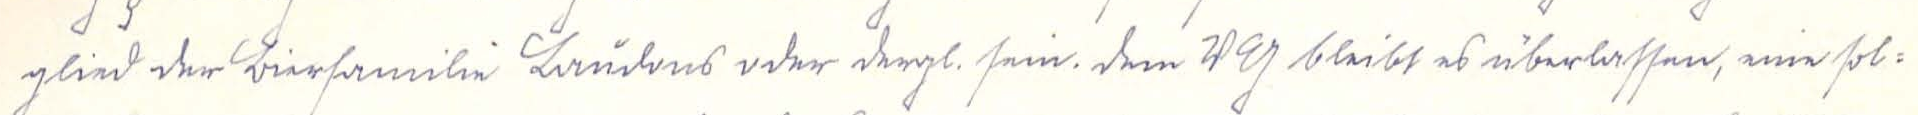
glied der Bierfamilie Laudons oder dergl. sein. Dem VG bleibt es überlassen eine sol-
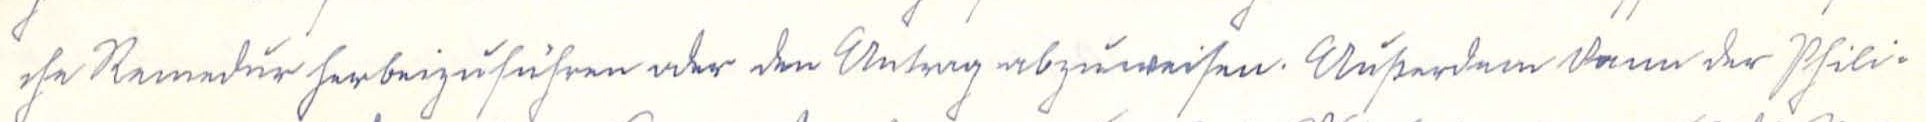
che Remedur herbeizuführen oder den Antrag abzuweisen. Außnahmen kann der Phili-
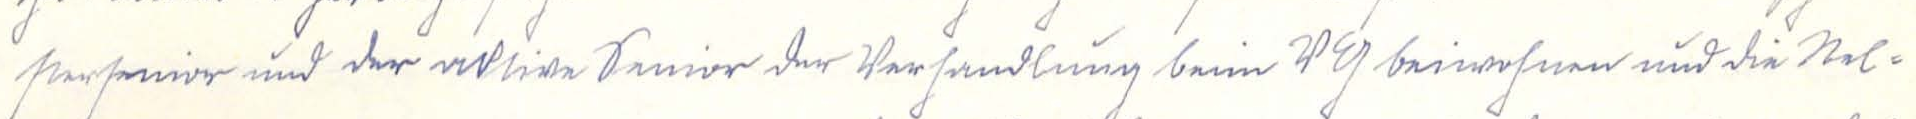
stersenior und der aktive Senior der Verhandlung beim VG beinehmen und die Stel-
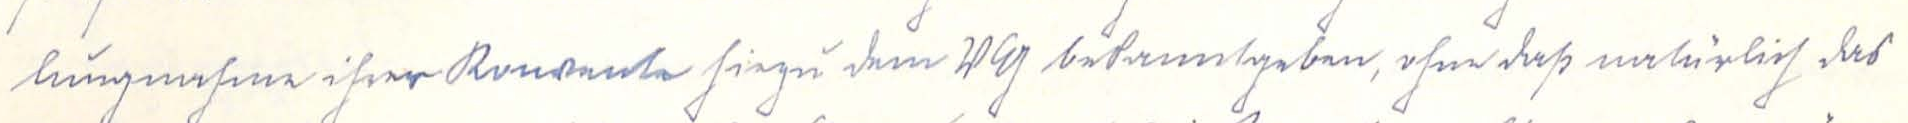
lungnahme ihrer Konvente hiezu dem VG bekanntgeben, ohne daß natürlich das
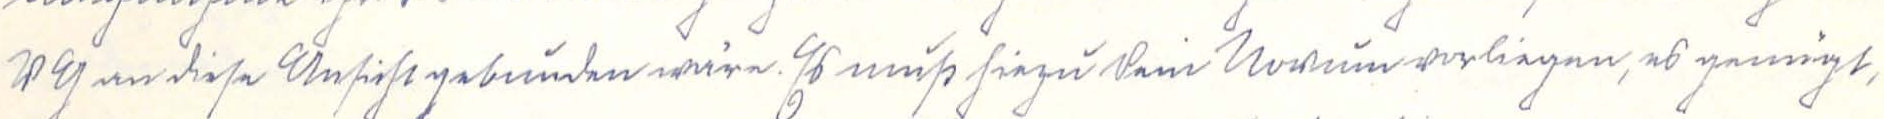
VG an diese Ansicht gebunden wäre. Es muß hiezu kein Novum vorliegen, es genügt,
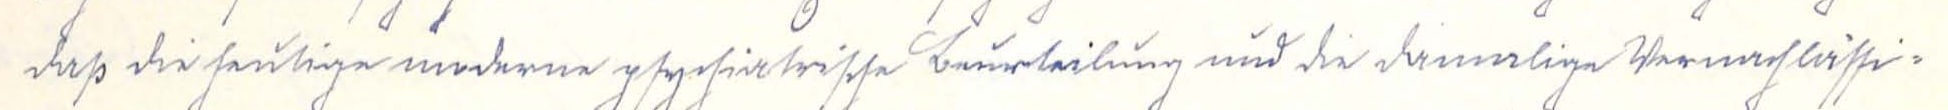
daß die heutige moderne psychiatrische Beurteilung und die damalige Vernachlässi-
